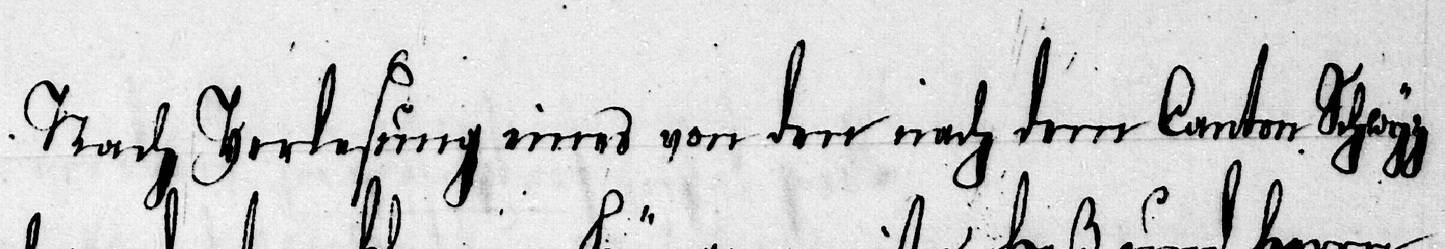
Nach Verlesung eines von den nach dem Canton Schwyz
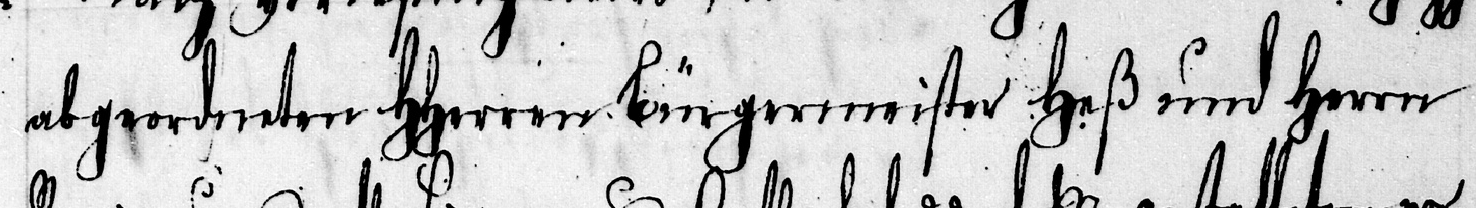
abgeordneten HHerren Bürgermeister Heß und Herrn
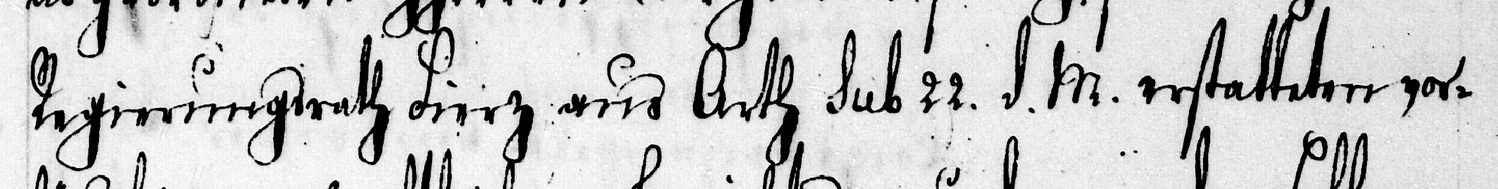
Regierungsrath Fierz aus Arth sub 22. d. M. erstatteten vor¬
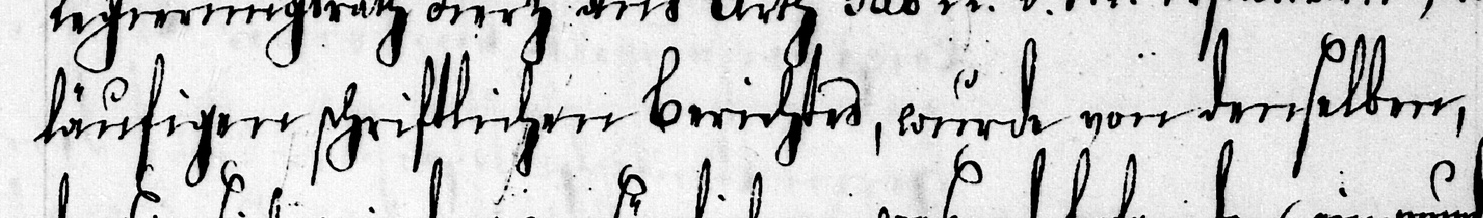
läufigen schriftlichen Berichtes, wurde von denselben,
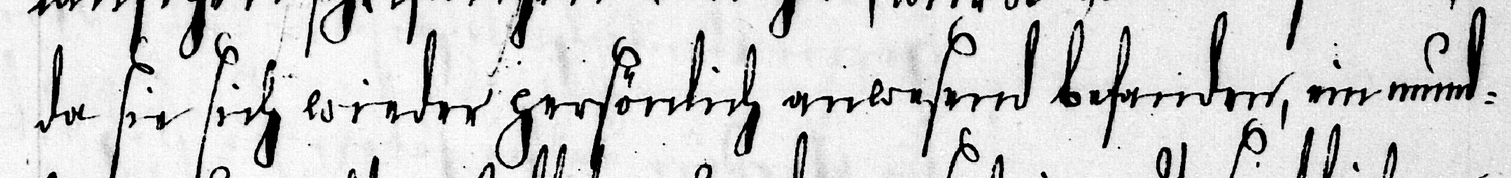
da sie sich wieder persönlich anwesend befanden, ein mund¬
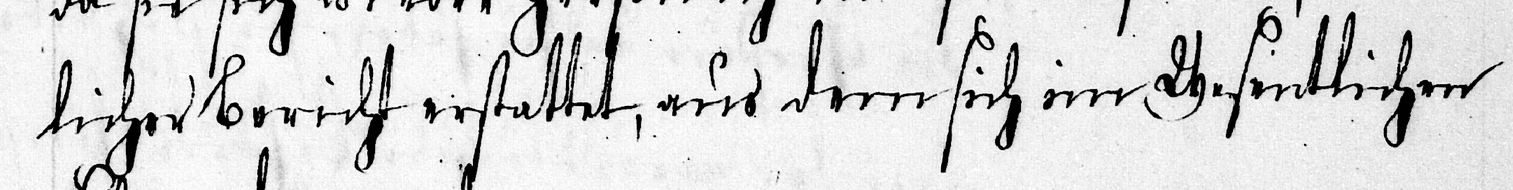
licher Bericht erstattet, aus dem sich im Wesentlichen
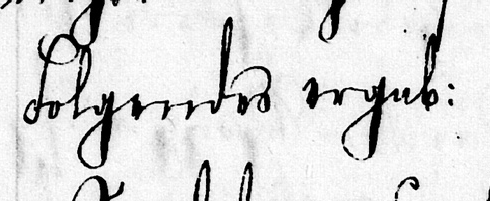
Folgendes ergab:
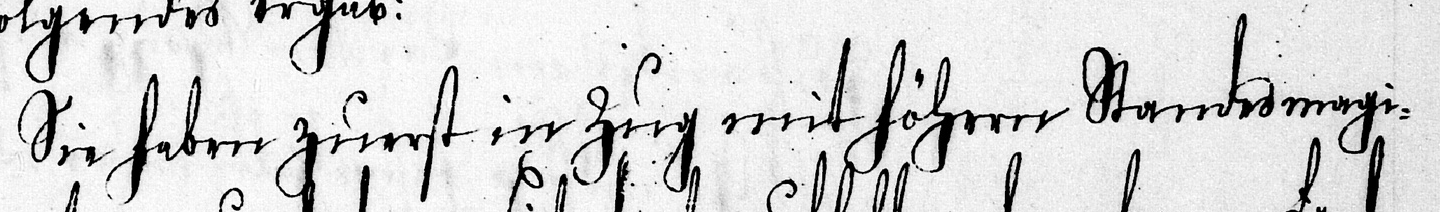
Sie haben zuerst in Zug mit höhern Standesmagi¬
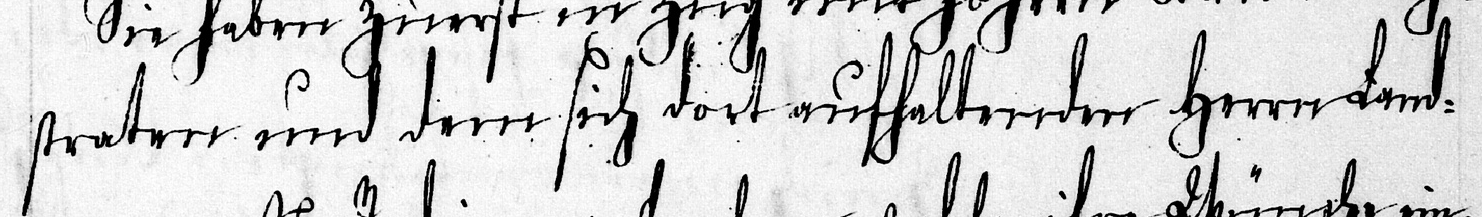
straten und dem sich dort aufhaltenden Herrn Land¬
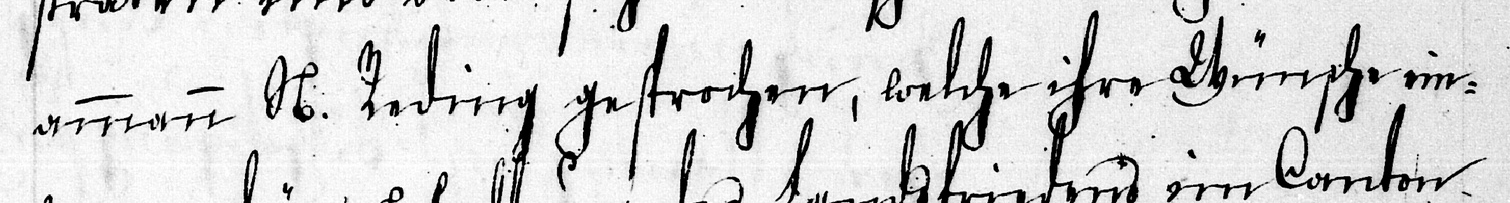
ammann N. Reding gesprochen, welche ihre Wünsche ein¬
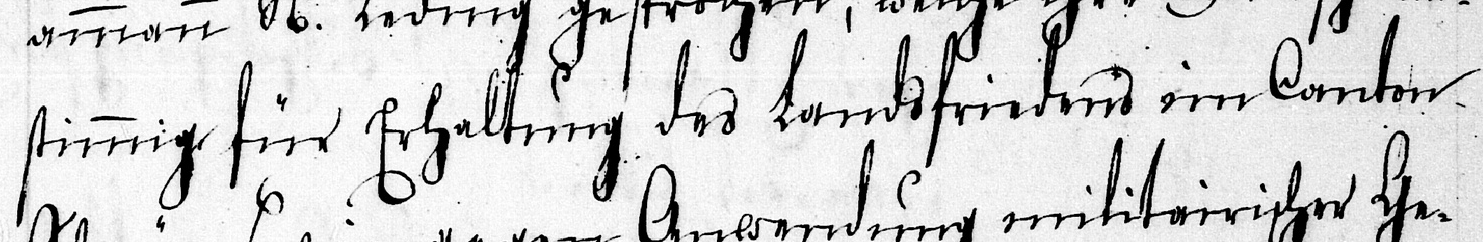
stimmig für Erhaltung des Landsfriedens im Canton
